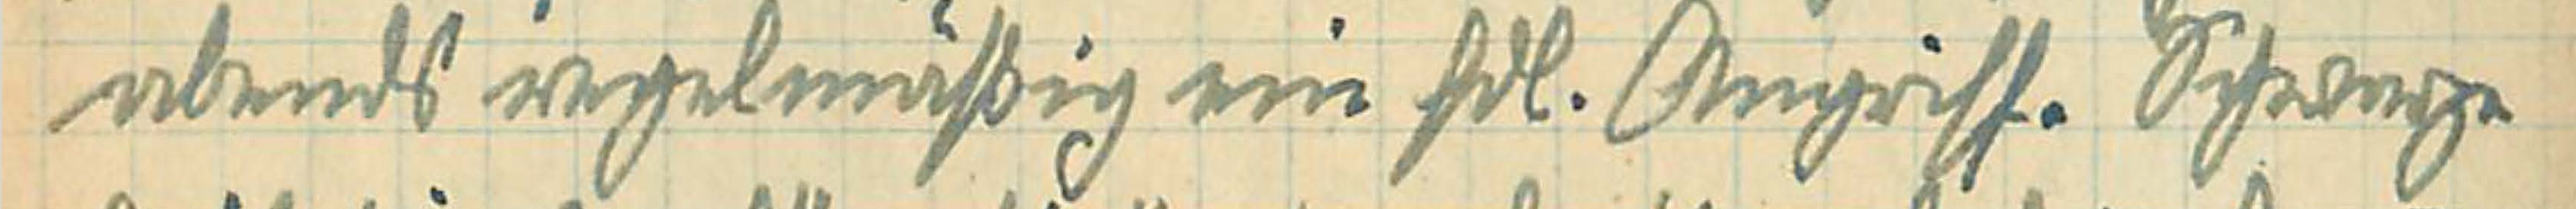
abends regelmäßig ein fdl. Angriff. Schwarze
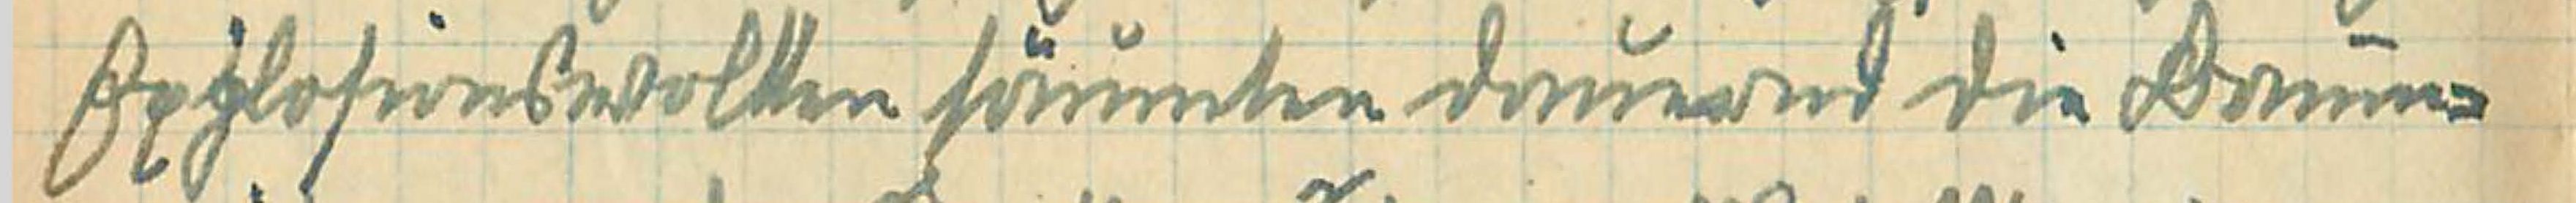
Explosionswolken säumten dauernd die Baum-
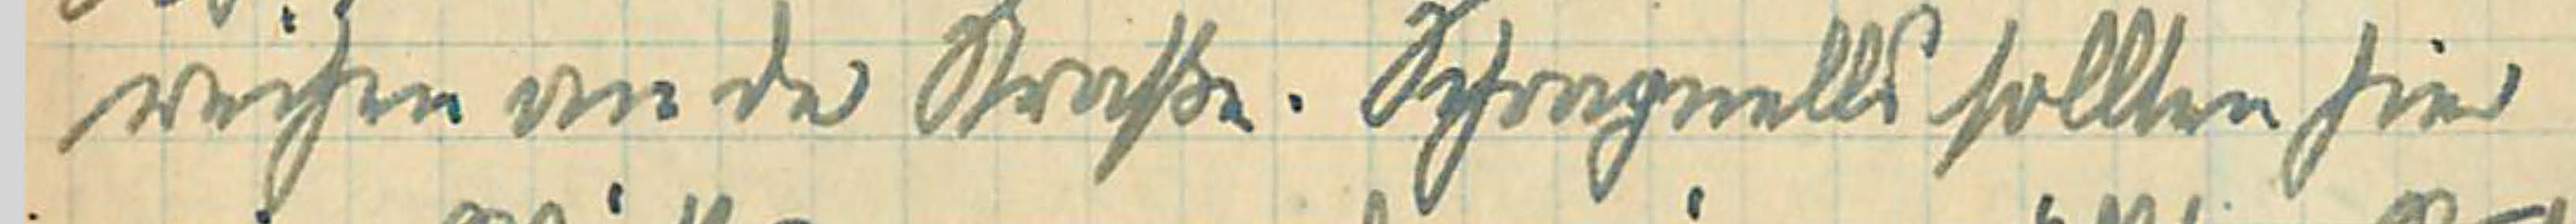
reihen an der Straße. Schrapnells sollten hier
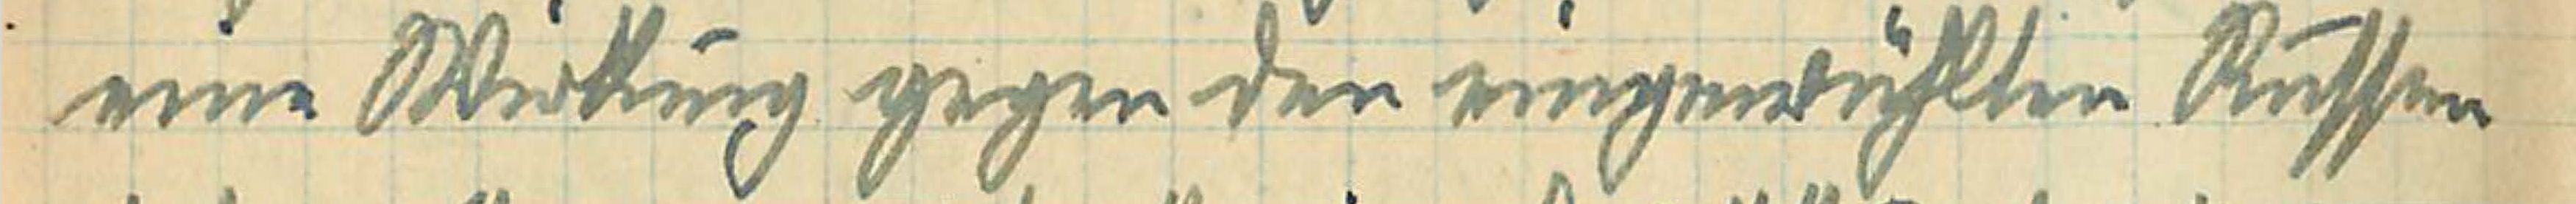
eine Wirkung gegen den eingewühlten Russen
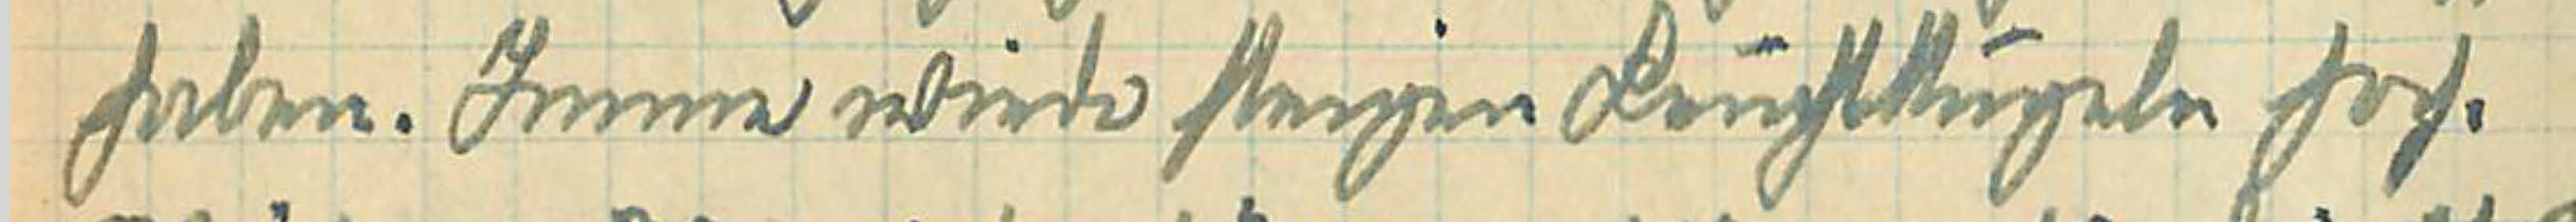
haben. Immer wieder steigen Leuchtkugeln hoch.
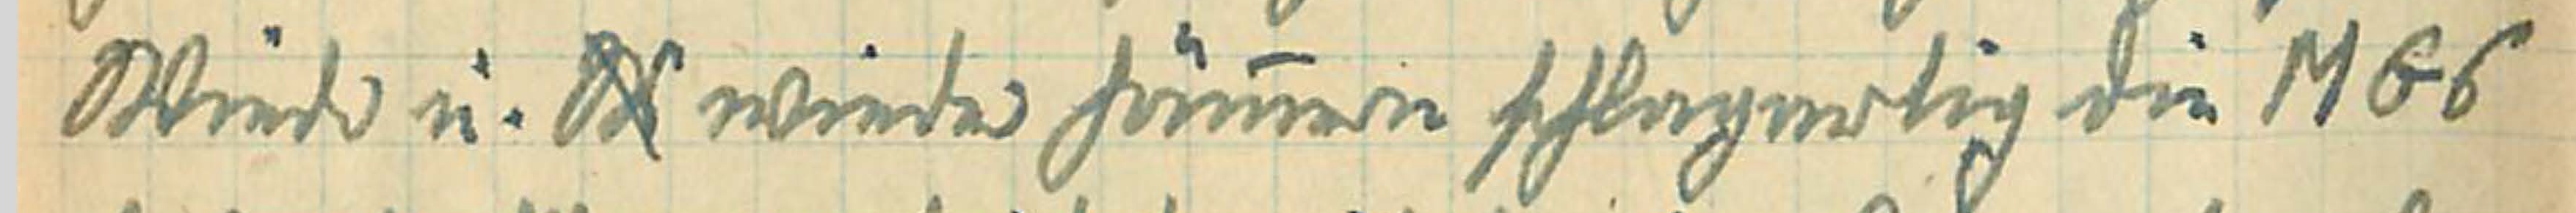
Wieder u. W wieder hämmern schlagartig die MGs
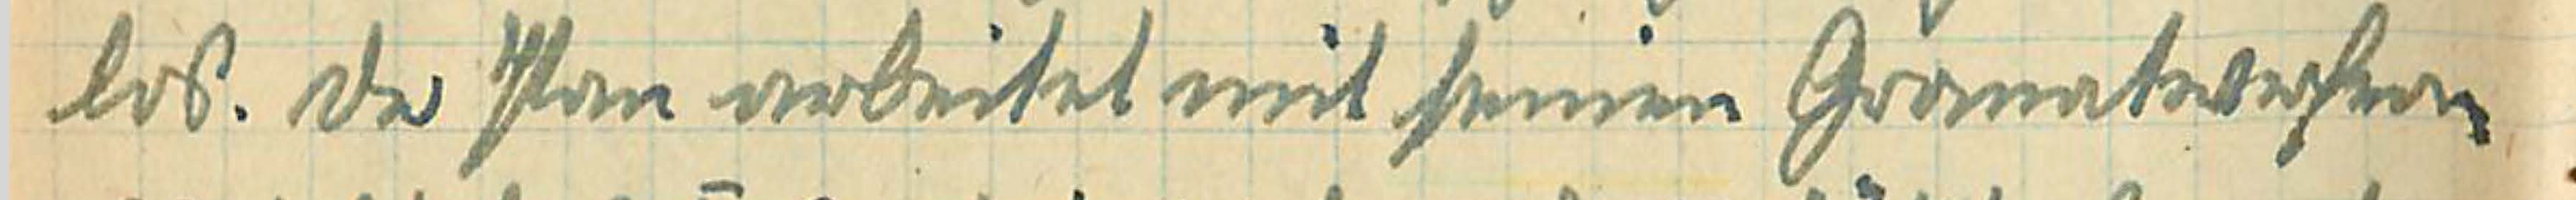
los. Der Pan arbeitet mit seinen Granatwerfern.
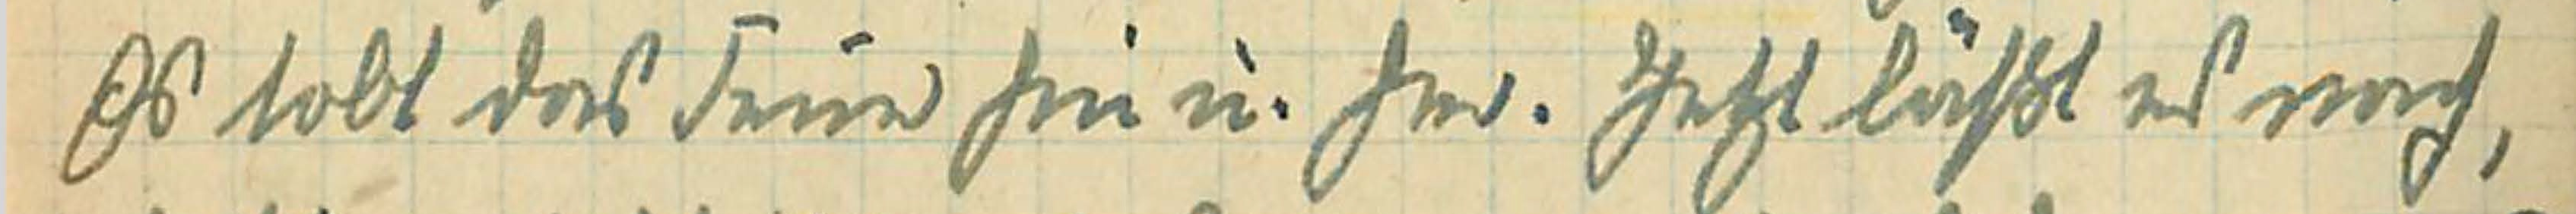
Es tobt das Feuer hin u. her. Jetzt läßt es nach,
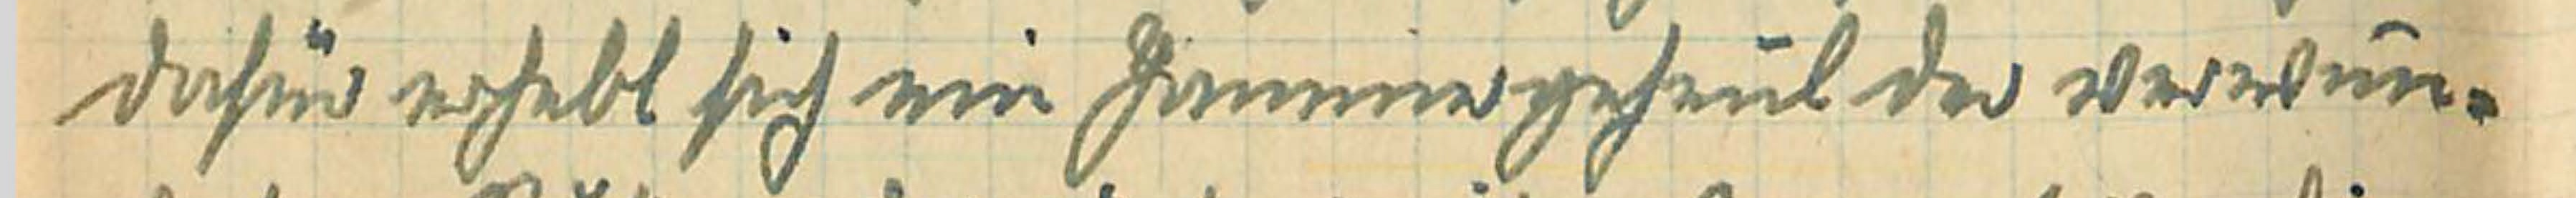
dafür erhebt sich ein Jammergeheul der verwun-
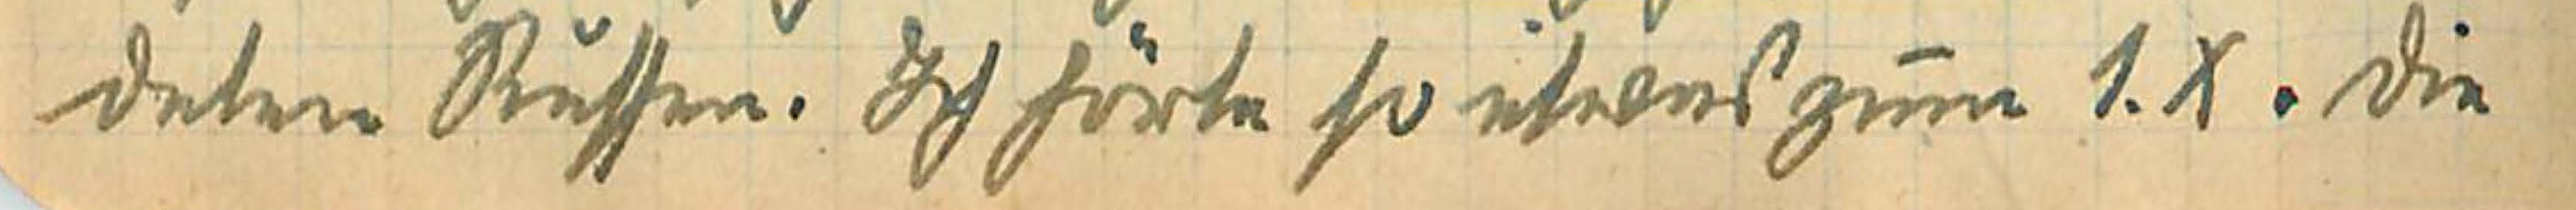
deten Russen. Ich hörte so etwas zum 1.X. Die
